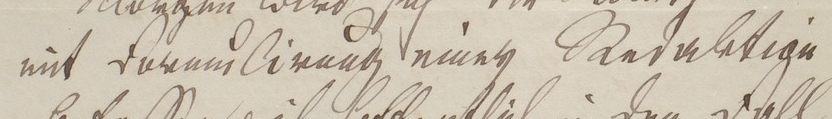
mit Formulirung einer Redaktion
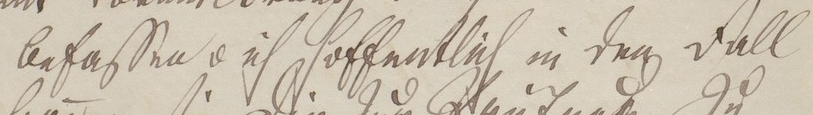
befassen & ich hoffentlich in den Fall
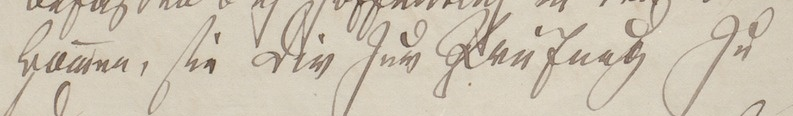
kommen, sie Dir zur Prüfung zu
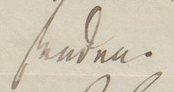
senden.
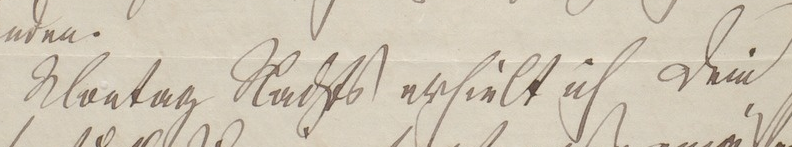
Montag Nachts erhielt ich Dein
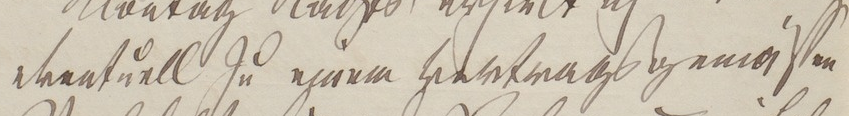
eventuell zu einem vertragsgemässen
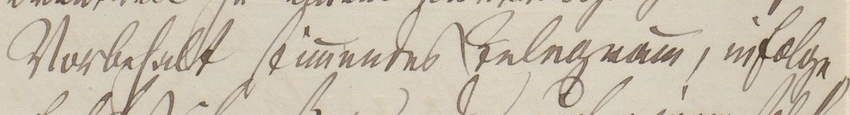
Vorbehalt stimmendes Telegramm, infolge
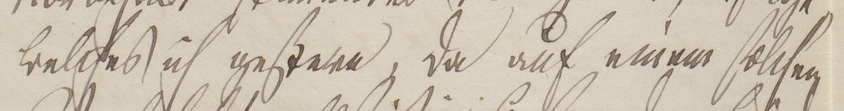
welches ich gestern, da auf einem solchen
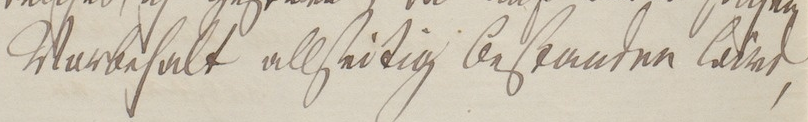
Vorbehalt allseitig bestanden wird,
